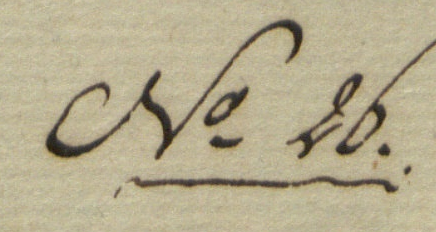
No 26.
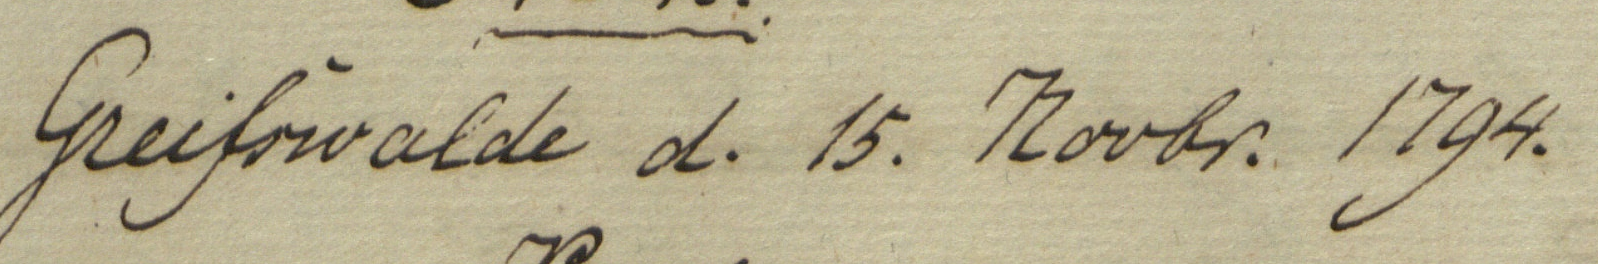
Greifswalde d. 15. Novbr. 1794.
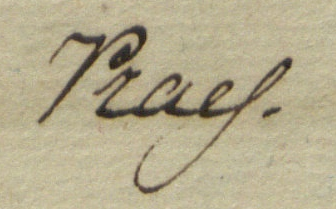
Praes.
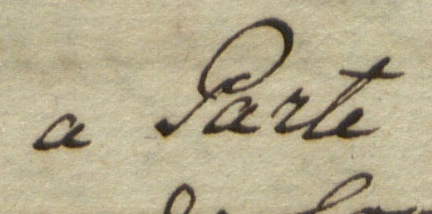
a Parte
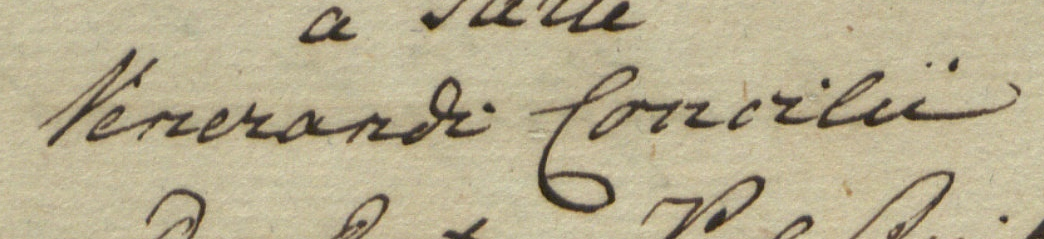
Venerandi Concilii
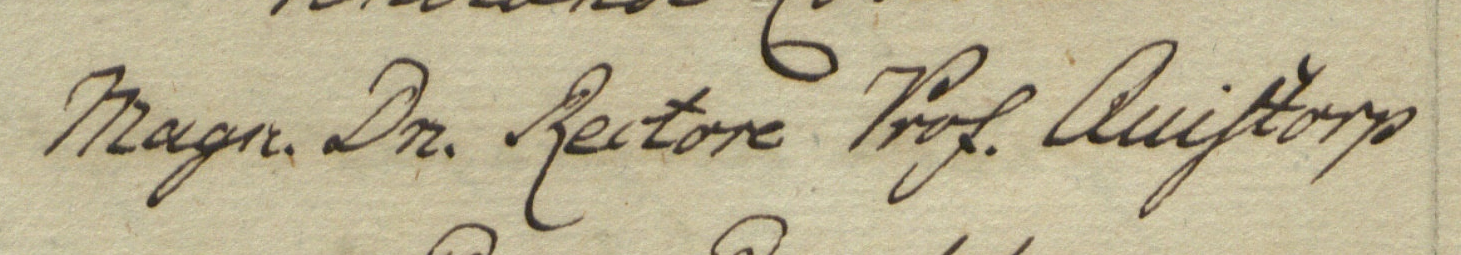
Magn. Dn. Rectore Prof. Quistorp
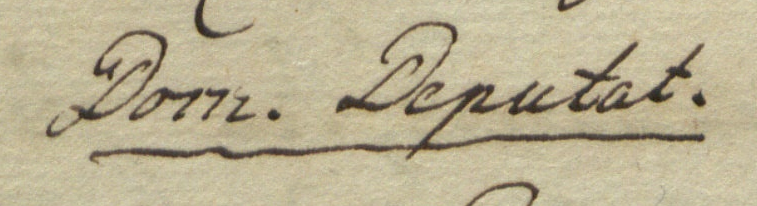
Dom. Deputat.
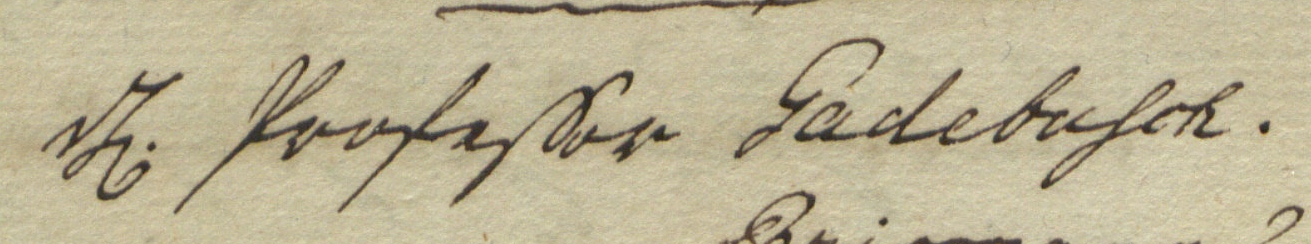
dh. Professor Gadebusch.
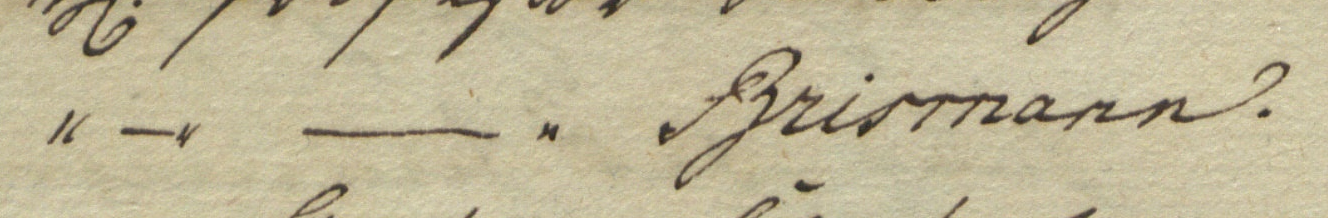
Brismann.
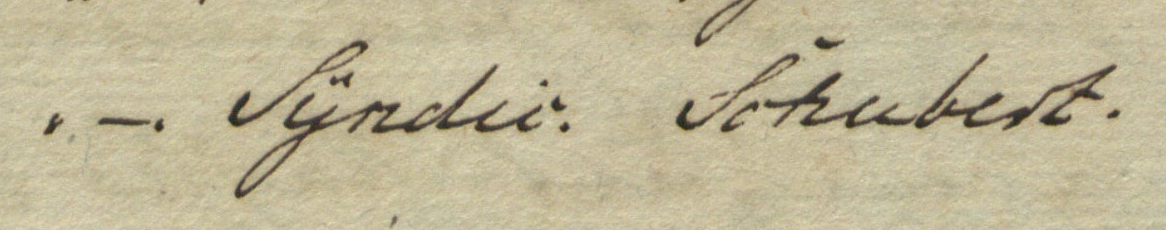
Sÿndic. Schubert.
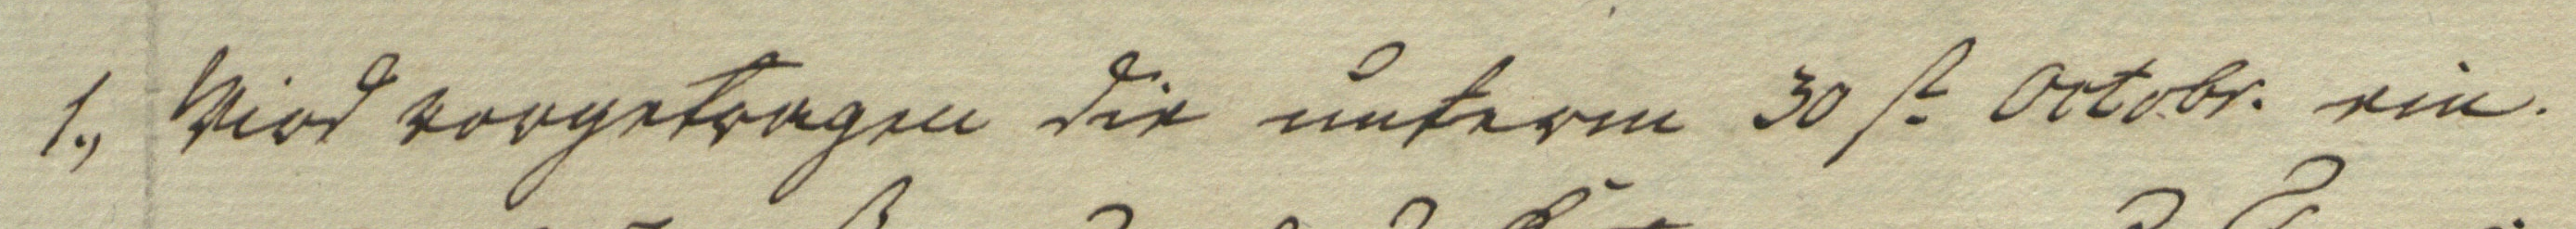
1. Wird vorgetragen die unterm 30 t Octobr. ein¬
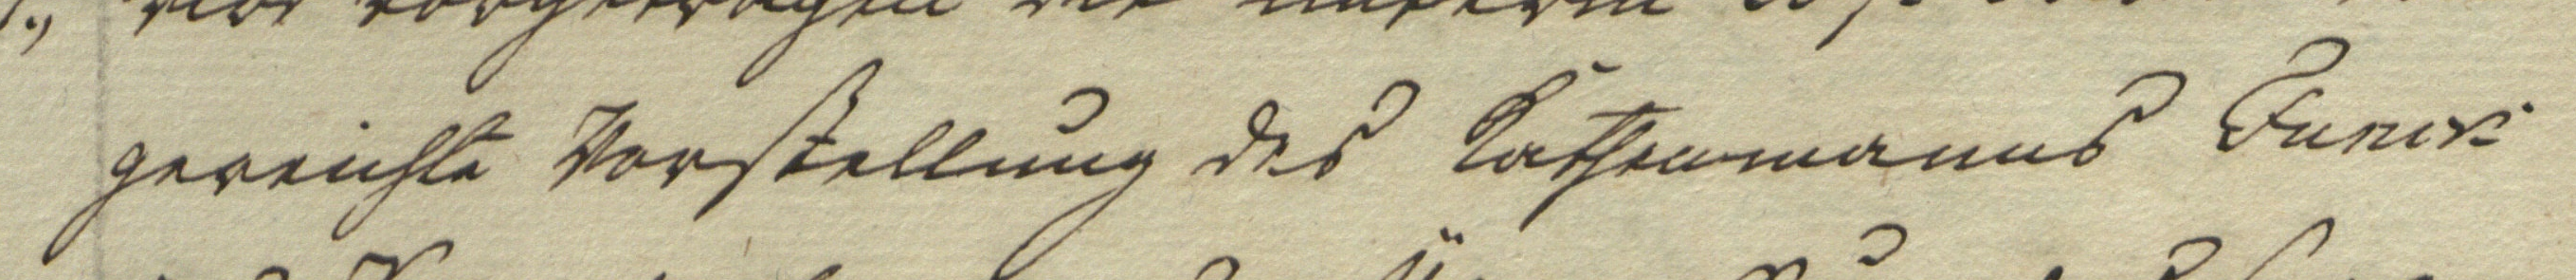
gereichte Vorstellung des Kathenmanns Funck
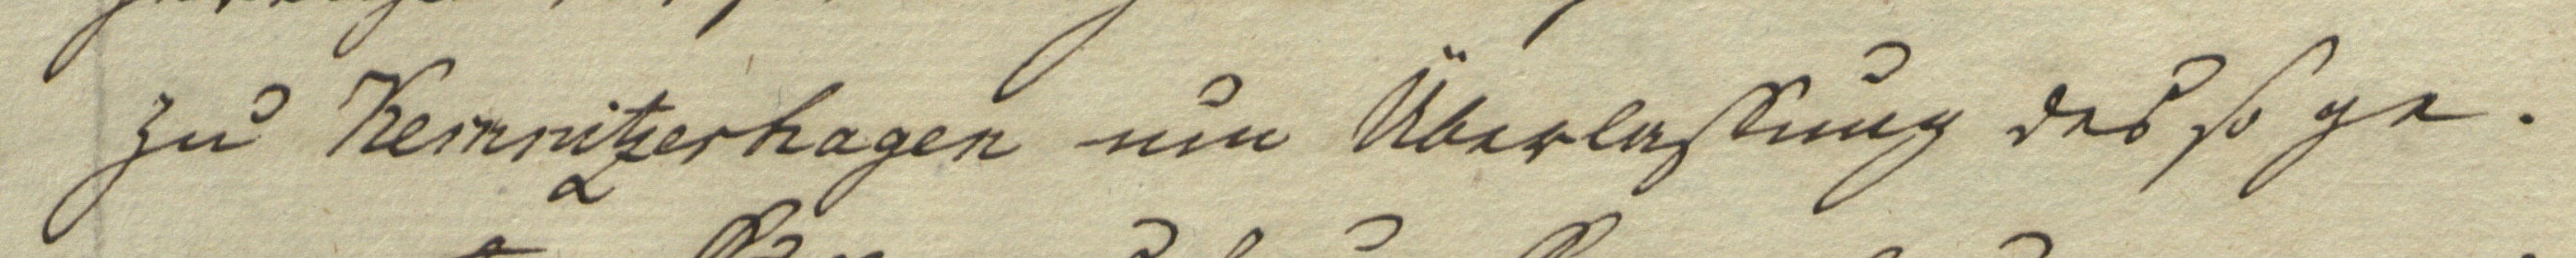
zu Kemnitzerhagen um Überlassung des so ge¬
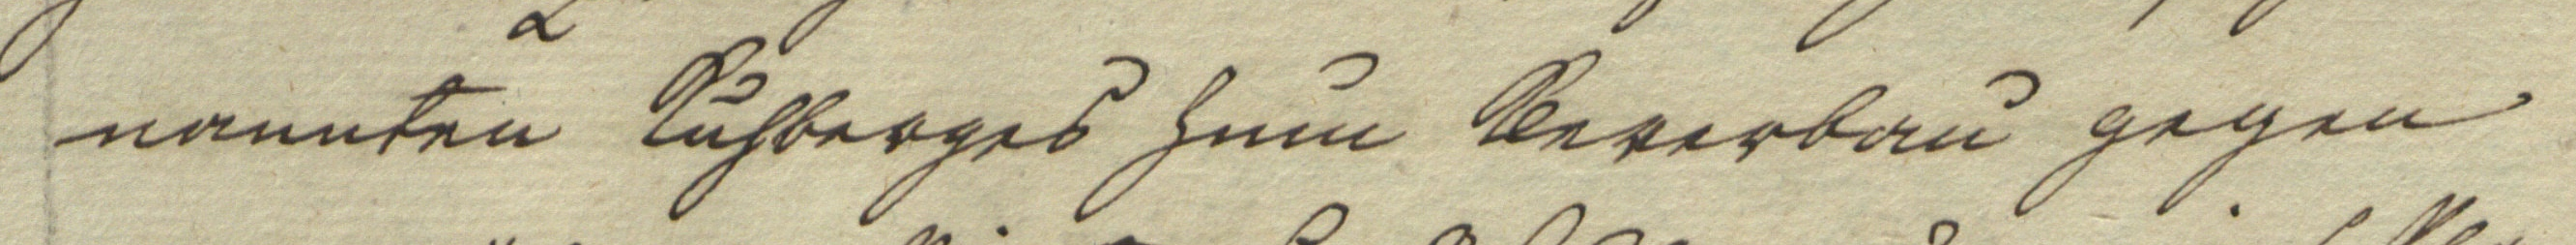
nannten Kuhberges zum Kleverbau gegen
